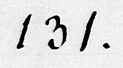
131.
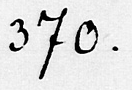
370.
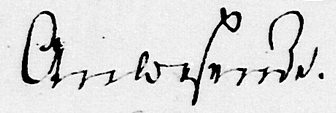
Anwesend.
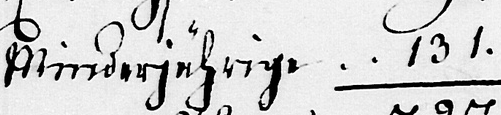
Minderjährige 131.
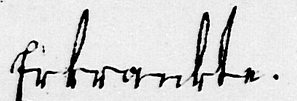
Erkrankte.
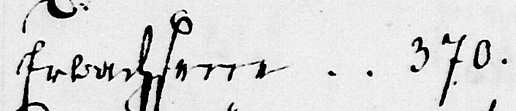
Erwachsene 370.
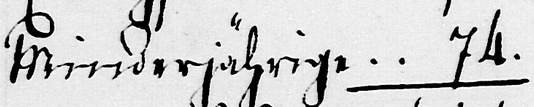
Minderjährige _74.
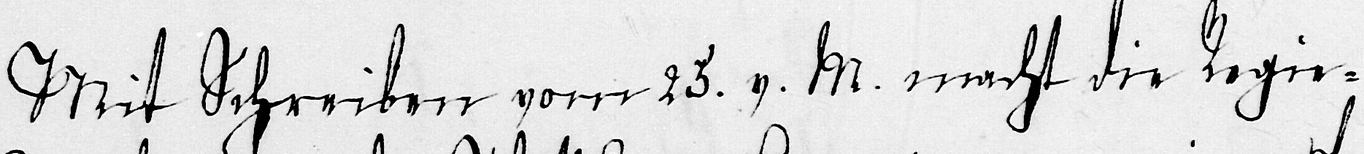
Mit Schreiben vom 25. v. M. macht die Regie¬
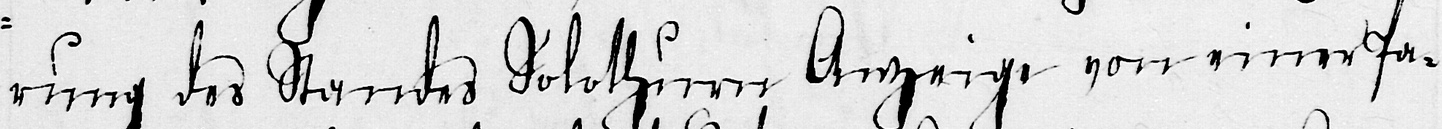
rung des Standes Solothurn Anzeige von einer Pa¬
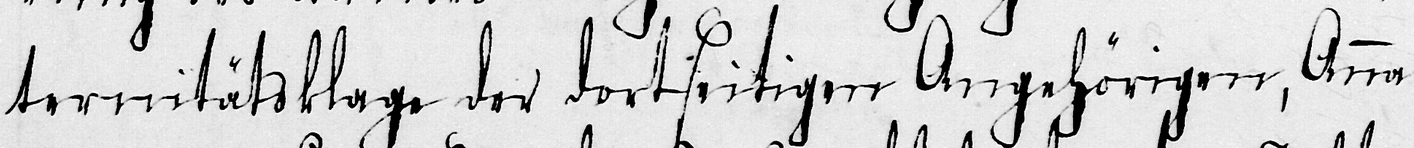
ternitätsklage der dortseitigen Angehörigen, Anna
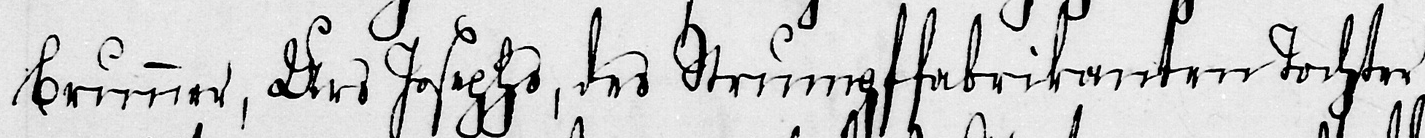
Brunner, Urs Josephs, des Strumpffabrikanten Tochter
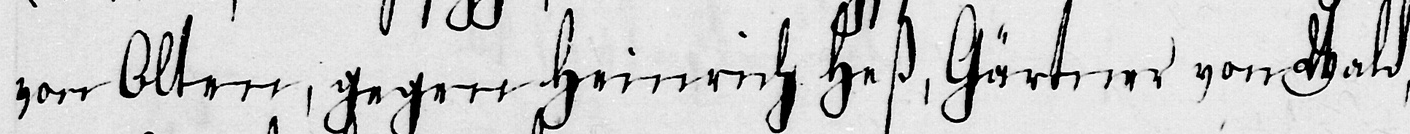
von Olten, gegen Heinrich Heß, Gärtner von Wald,
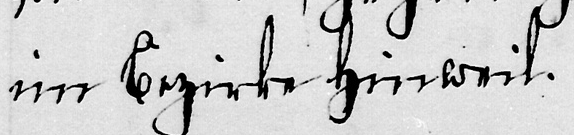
im Bezirke Hinweil.
